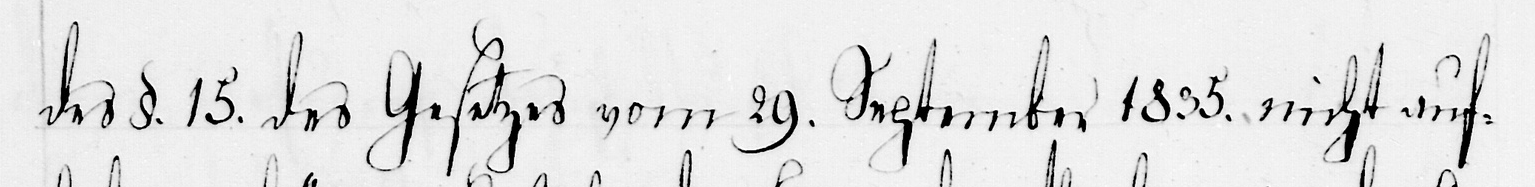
des §. 15. des Gesetzes vom 29. September 1835. nicht auf¬
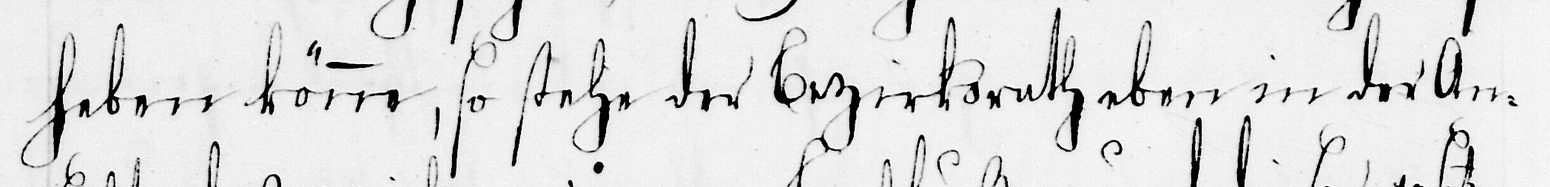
heben könne, so stehe der Bezirksrath eben in der An¬
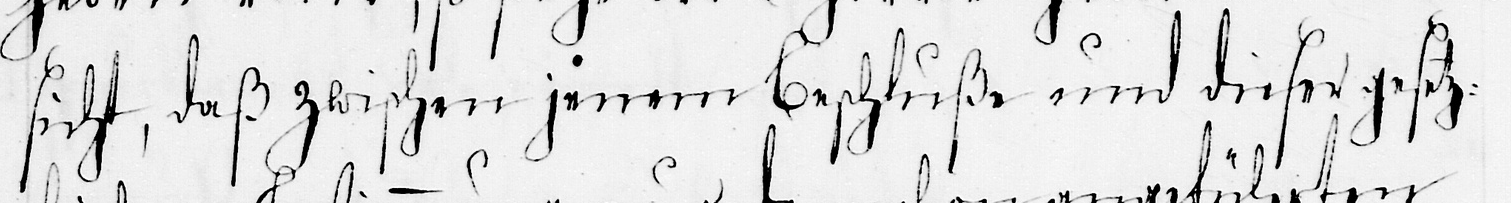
sicht, daß zwischen jenem Beschluße und dieser gesetz¬
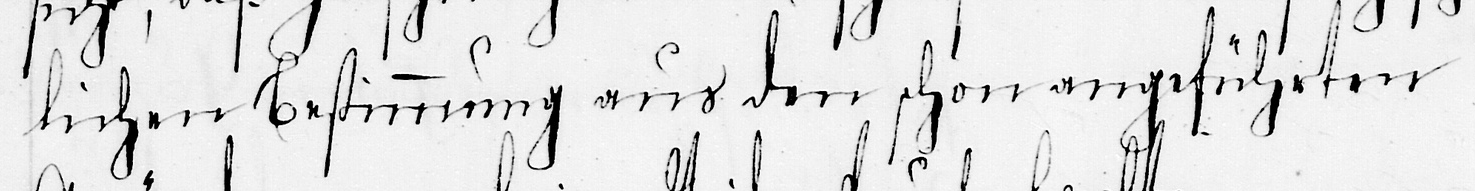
lichen Bestimmung aus den schon angeführten
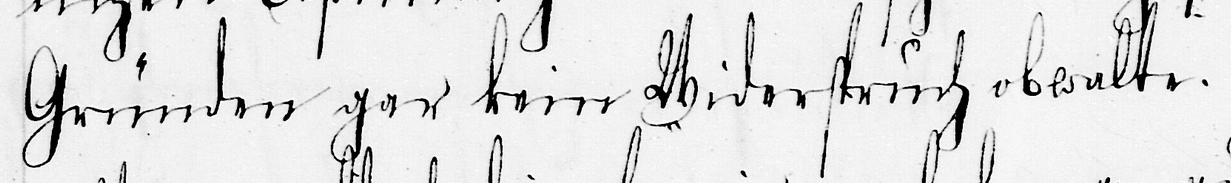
Gründen gar kein Widerspruch obwalte.
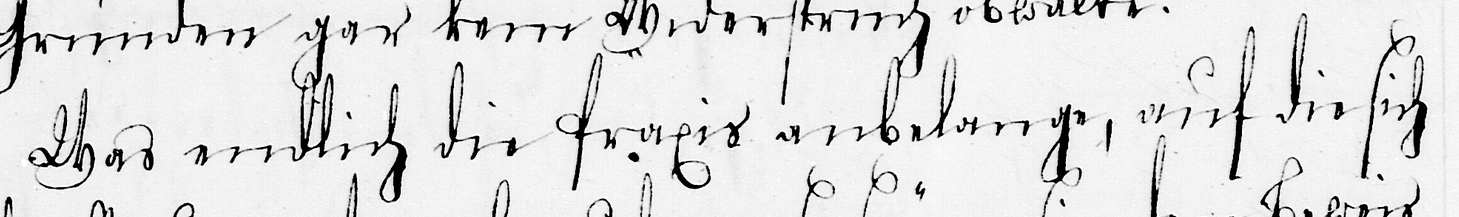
Was endlich die Praxis anbelange, auf die sich
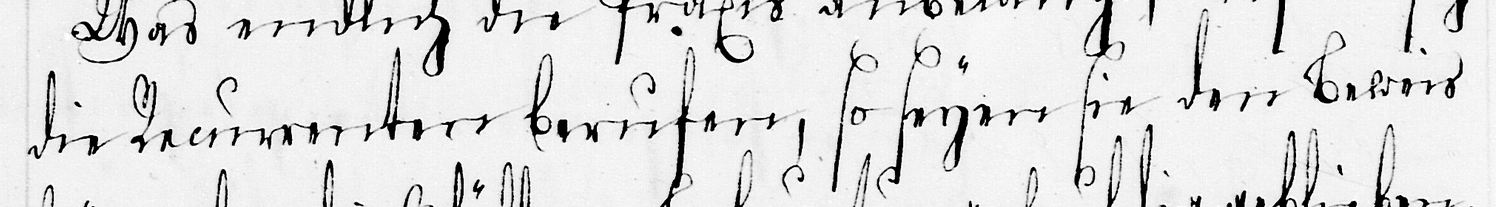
die Recurrenten berufen, so seyen sie den Beweis
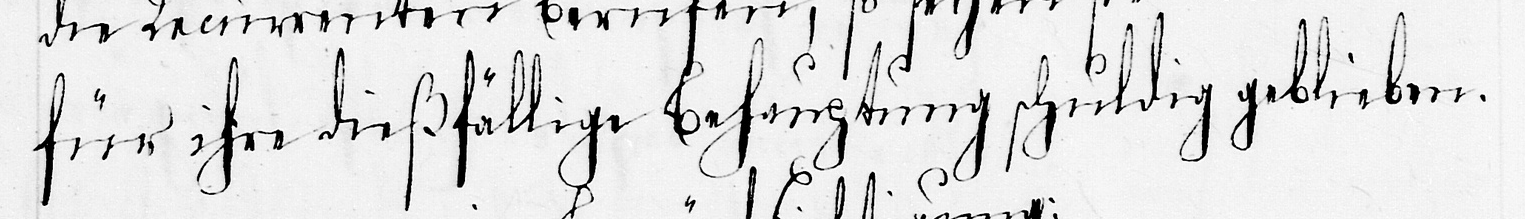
für ihre dießfällige Behauptung schuldig geblieben.
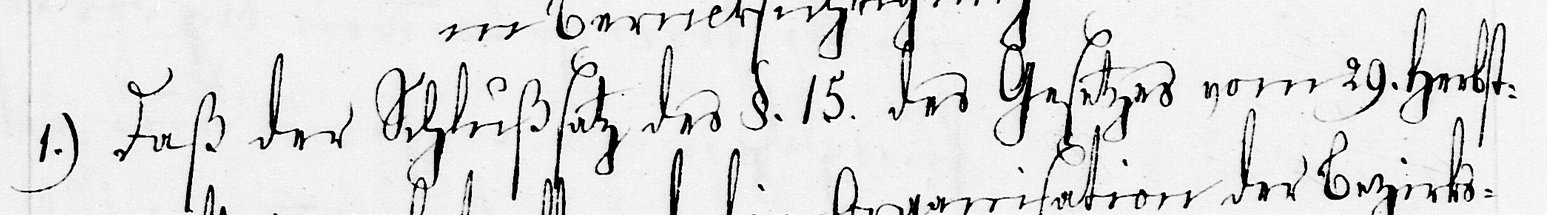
1.) Daß der Schlußsatz des §. 15. des Gesetzes vom 29. Herbst¬
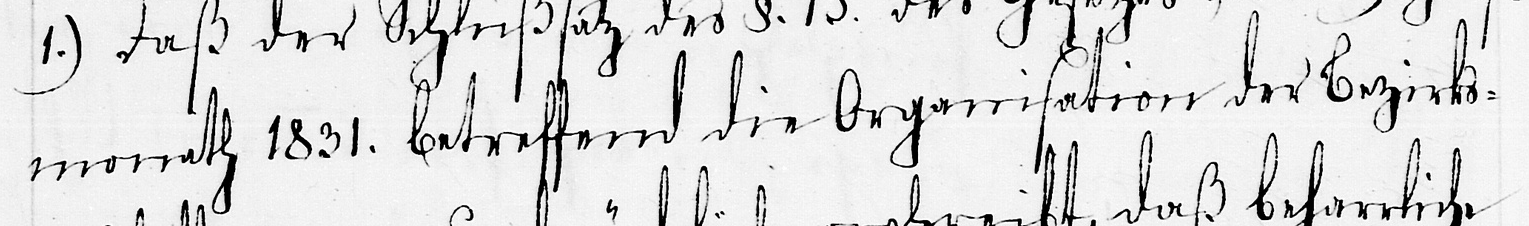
monath 1831. betreffend die Organisation der Bezirks¬
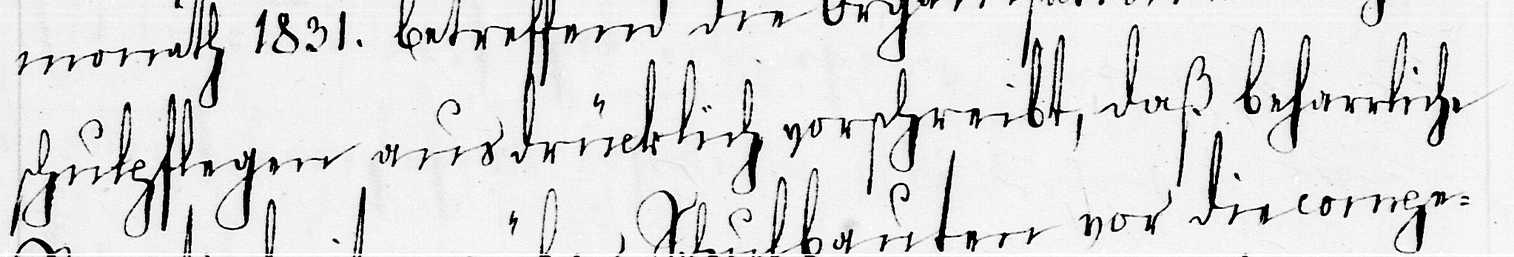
schulpflegen ausdrücklich vorschreibt, daß beharrliche
